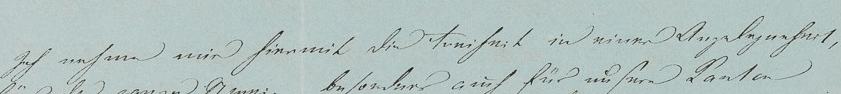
Ich nehme mir hiermit die Freiheit in einer Angelegenheit,
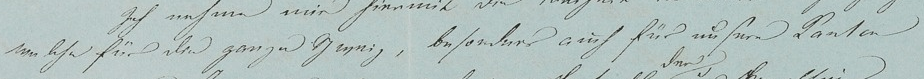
welche für die ganze Schweiz, besonders auch für unsern Kanton
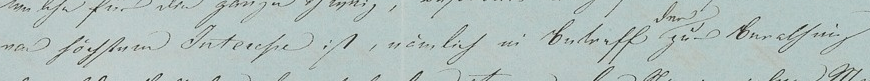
von höchstem Interesse ist, nämlich in Betreff der zur Berathung
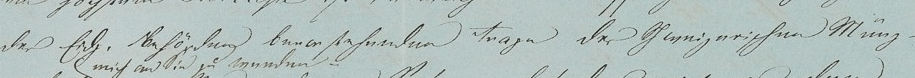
der Eidg. Behörden bevorstehenden Frage der Schweizerischen Münz-
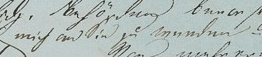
mich an Sie zu wenden. –
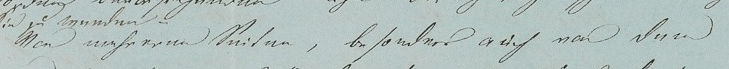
Von mehreren Seiten, besonders auch von dem
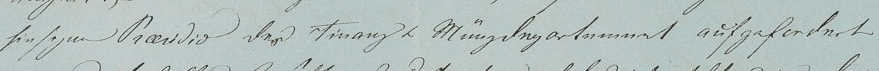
hiesigen Præsidio des Finanz- u Münzdepartement aufgefordert
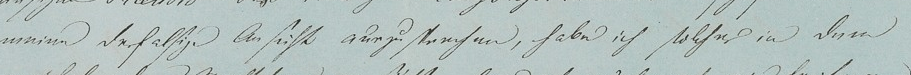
meine desfalsige Ansicht auszusprechen, habe ich solches in dem
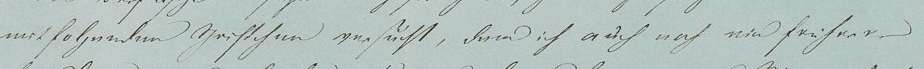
mitfolgenden Schriftchen versucht, dem ich auch noch ein früheres
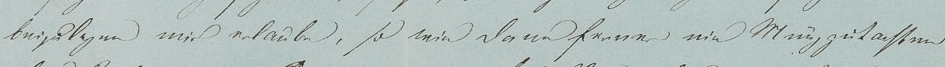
beizulegen mir erlaube, so wie dann ferner ein Münzgutachten
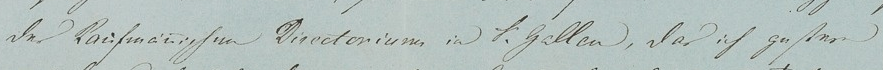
des Kaufmännischen Directoriums in St. Gallen, das ich gestern
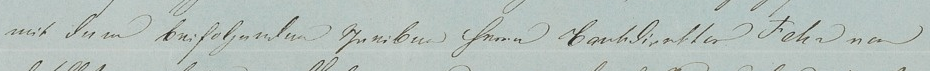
mit dem beifolgenden Schreiben Herrn Bankdirektor Fehr von
